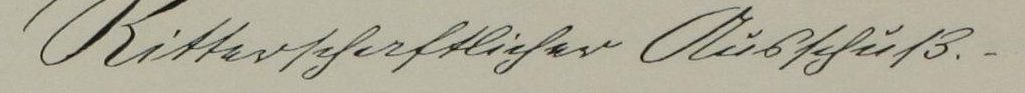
Ritterschaftlicher Ausschuß.
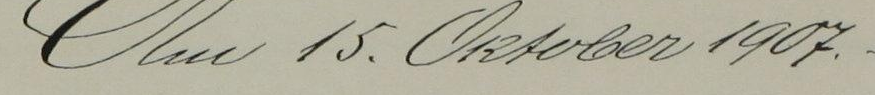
Am 15. Oktober 1907.
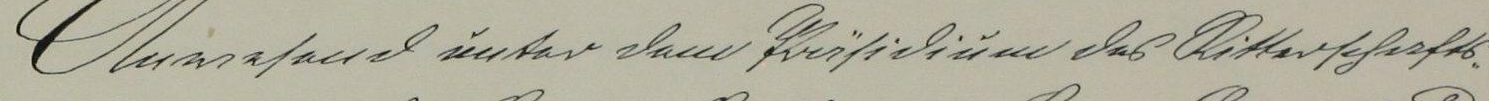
Anwesend unter dem Präsidium des Ritterschafts-
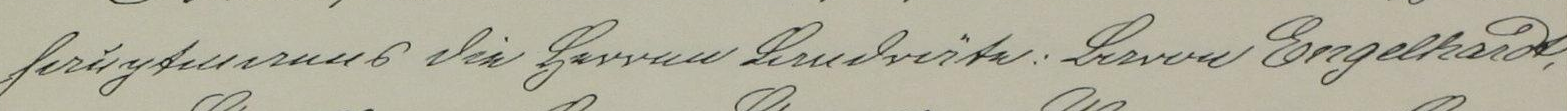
hauptmanns die Herren Landräte: Baron Engelhardt,
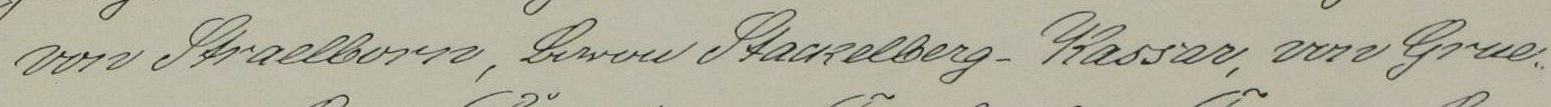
von Straelborn, Baron Stackelberg-Kassar, von Grue-
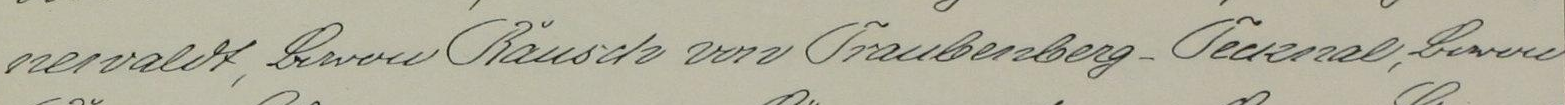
newaldt, Baron Rausch von Traubenberg-Tecknal, Baron
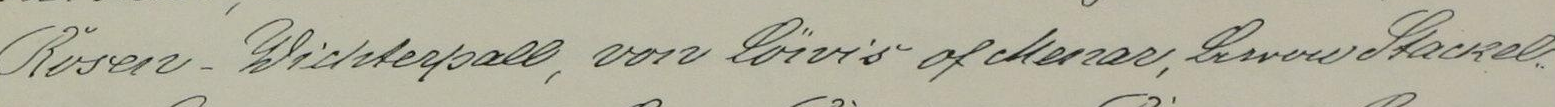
Rosen-Wichterpall, von Löwis of Menar, Baron Stackel-
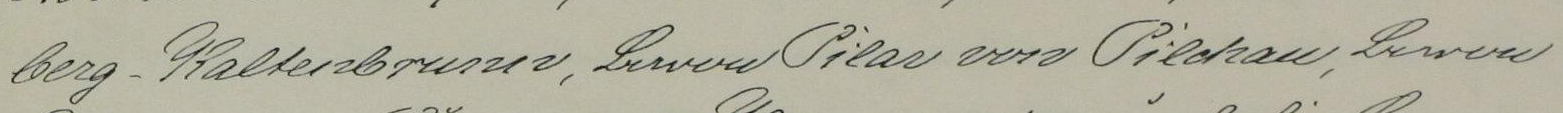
berg-Kaltenbrunn, Baron Pilar von Pilchau, Baron
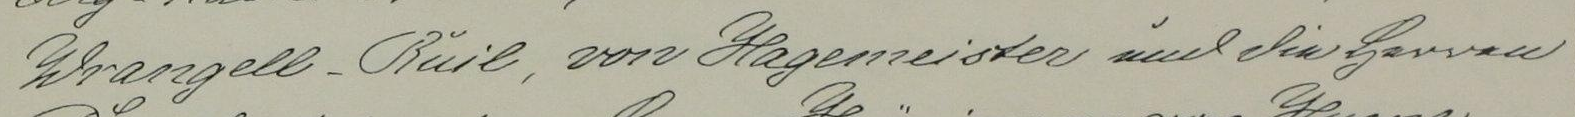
Wrangell-Ruil, von Hagemeister und die Herren
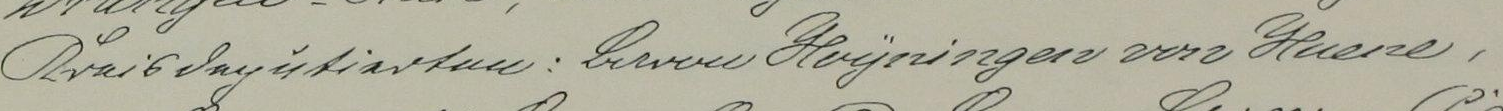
Kreisdeputierten: Baron Hoyningen von Huene,
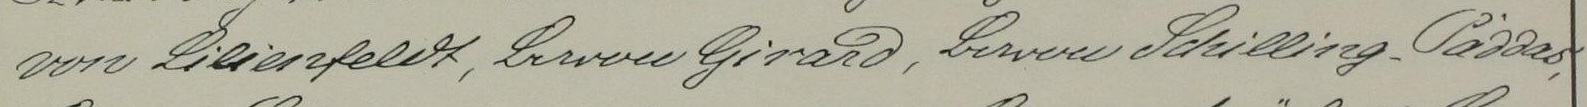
von Lilienfeldt, Baron Girard, Baron Schilling-Paddas,
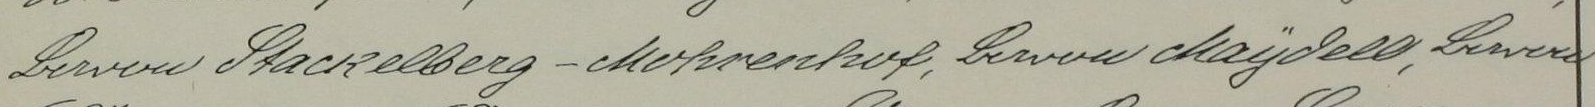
Baron Stackelberg-Mohrenhof, Baron Maydell, Baron
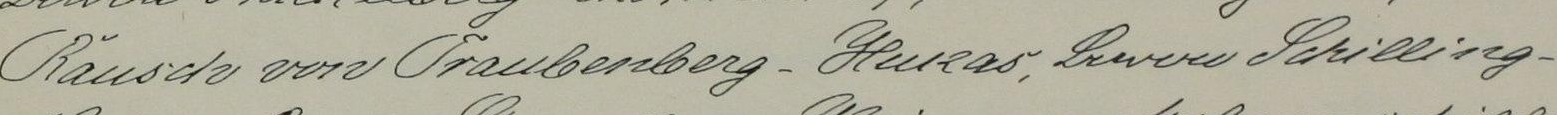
Rausch von Traubenberg-Hukas, Baron Schilling-
